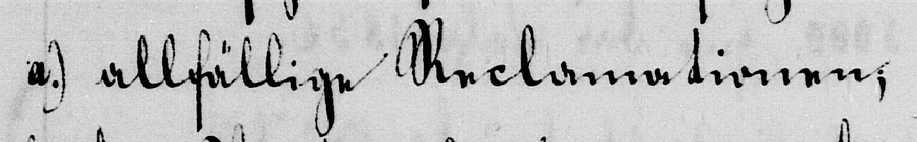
a.) allfällige Reclamationen;
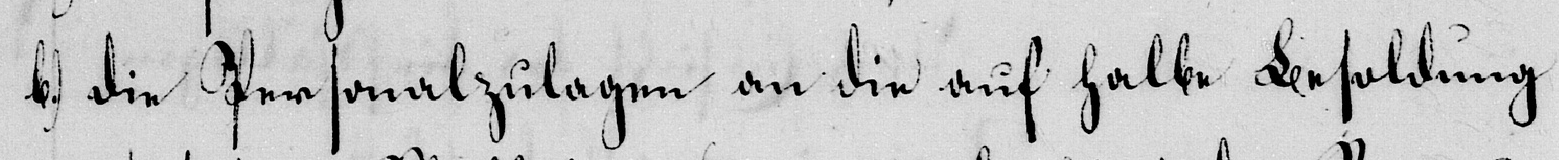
b.) die Personalzulagen an die auf halbe Besoldung
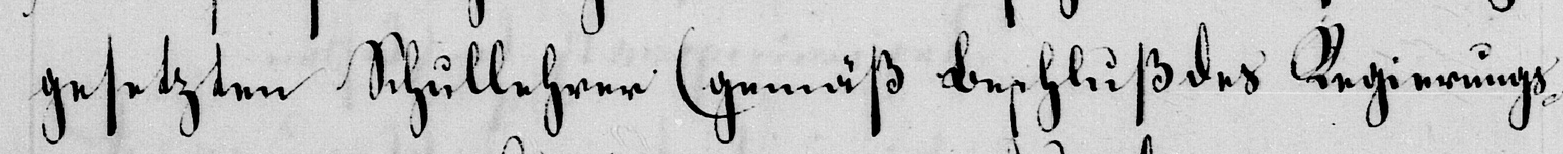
gesetzten Schullehrer (gemäß Beschluß des Regierungs¬
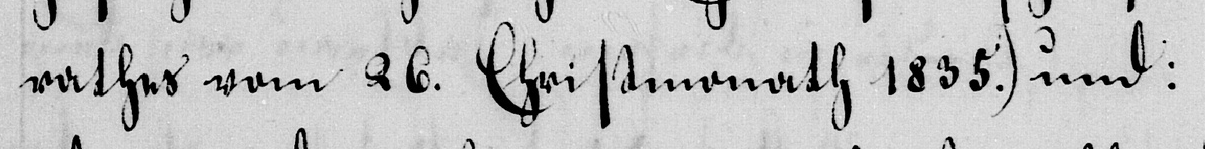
rathes vom 26. Christmonath 1835.) und:
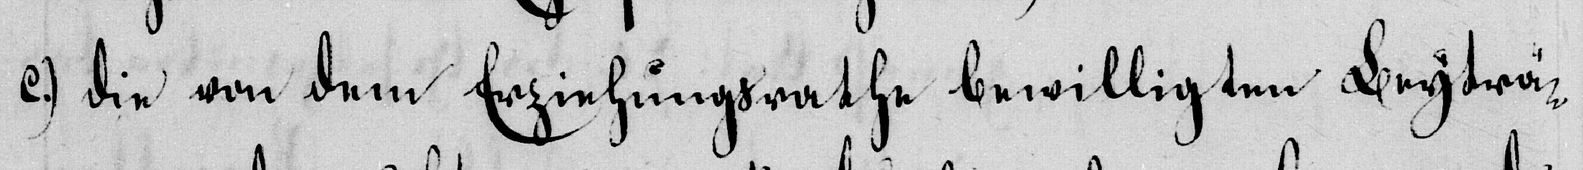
c.) die von dem Erziehungsrathe bewilligten Beyträ¬
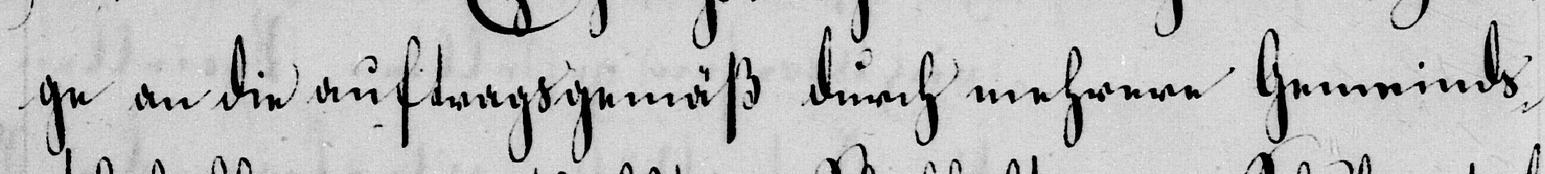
ge an die auftragsgemäß durch mehrere Gemeinds¬
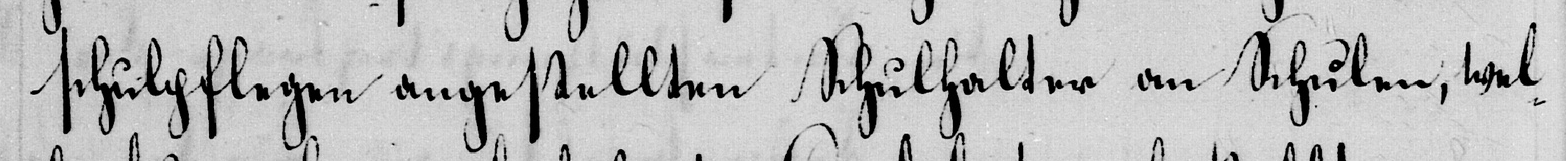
schulpflegen angestellten Schulhalter an Schulen, wel¬
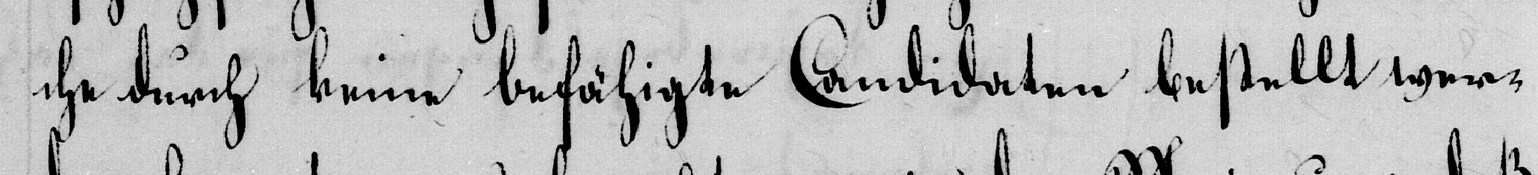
che durch keine befähigte Candidaten bestellt wer¬
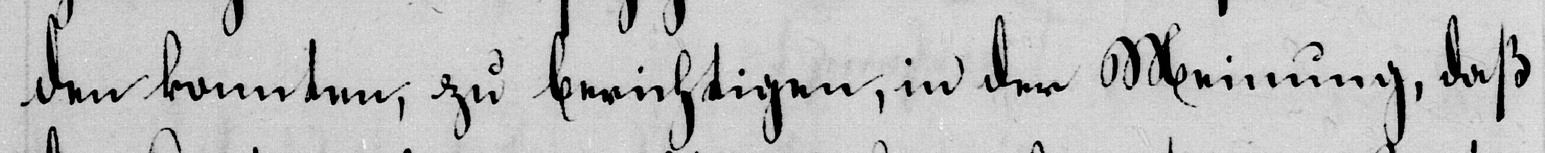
den konnten, zu berichtigen, in der Meinung, daß
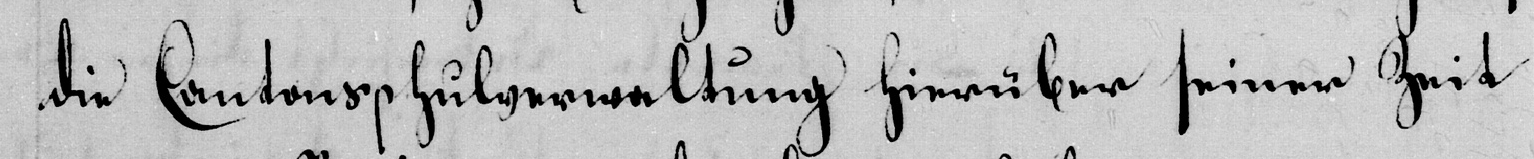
die Cantonsschulverwaltung hierüber seiner Zeit
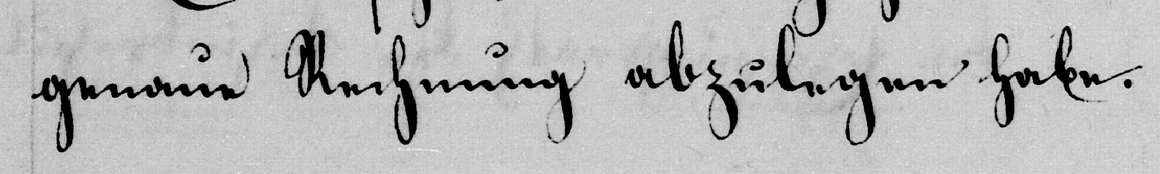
genaue Rechnung abzulegen habe.
